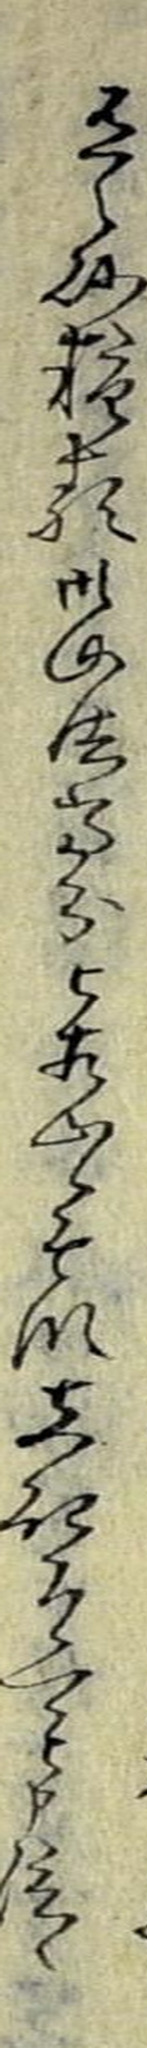有之砂糖類御趣法当分被相止候其段支配下へ可被申渡候
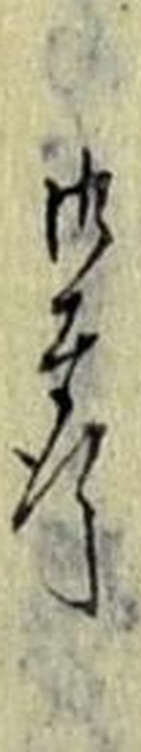御奉行
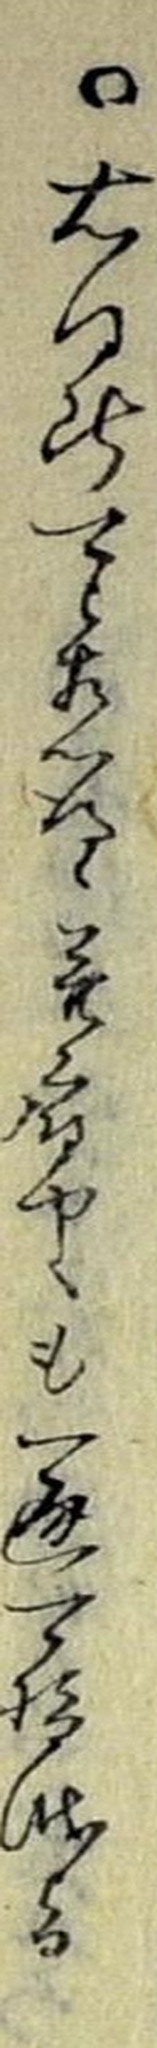○右同断可被相心得候并府中へも一通可指越旨
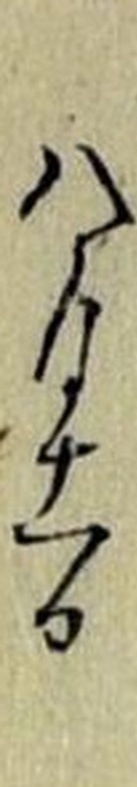八月十一日
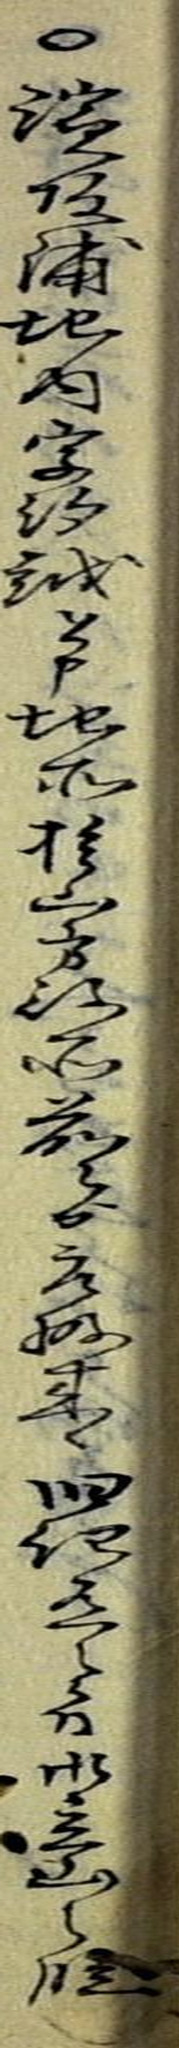○浜坂浦地内字汐越と申地所松山方役所前々ゟ取扱来候旧記有之に付御立山之段
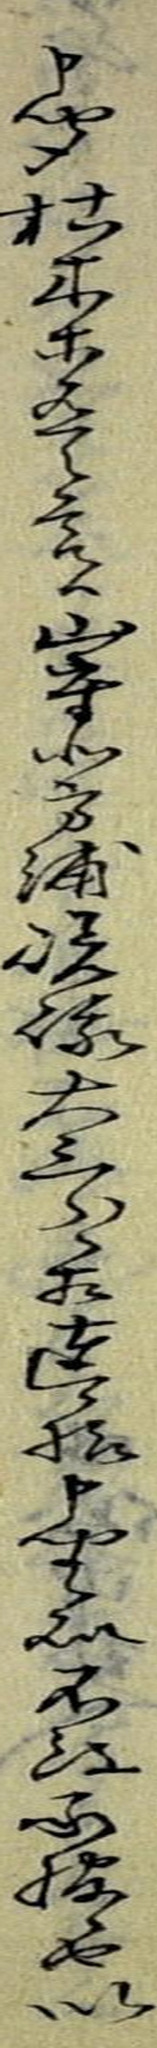申聞枯木等有之節は山守北方浦嵯俄大三郎へ相達候様申聞候処不致承服候由以
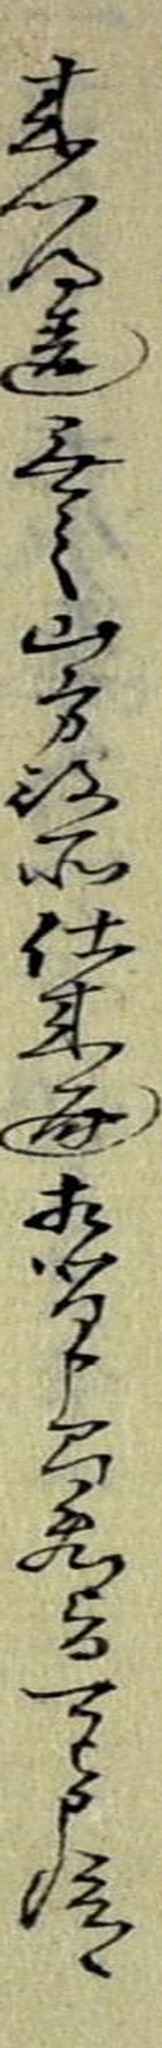来心得違無之山方役所仕来通相背申間敷旨可被申渡候
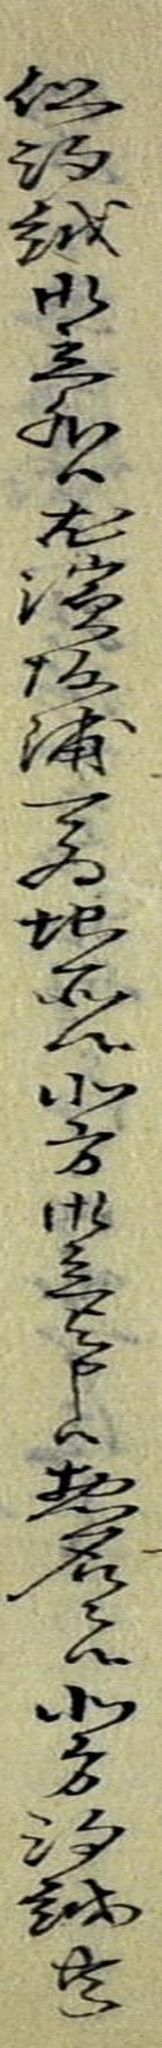但汐越御立外は尤浜坂浦可為地所候北方御立と申は惣名に候北方汐越共
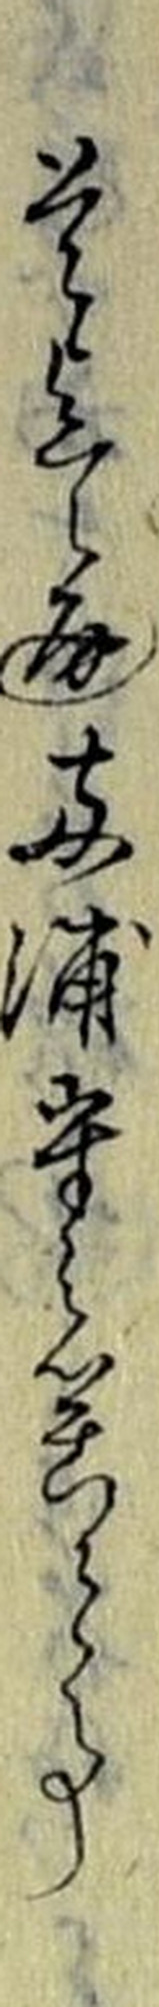是迄之通両浦守之筈に候事
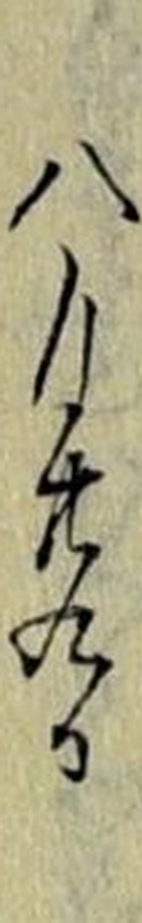八月廿九日
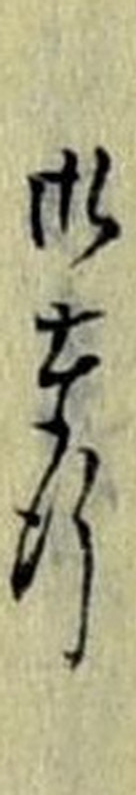御奉行
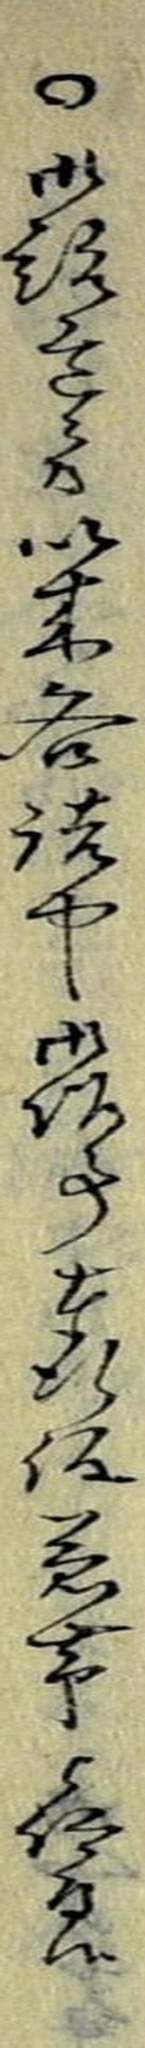○御趣意に付以来各詰中御作事奉行仮兼帯被仰付候
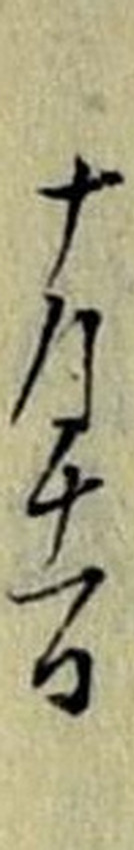十月十一日
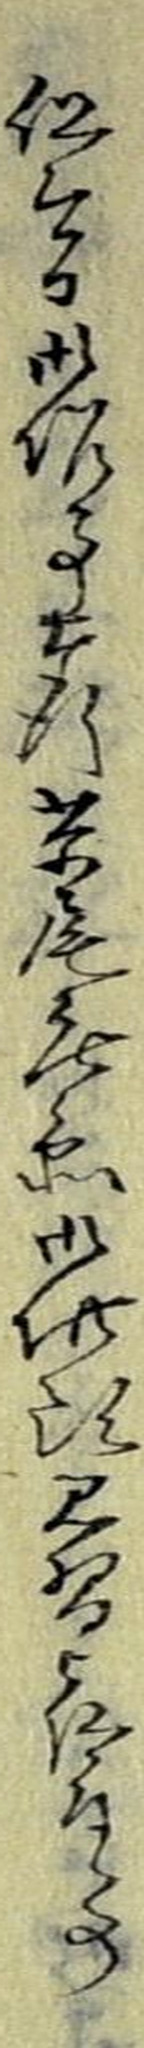但今日御作事奉行草尾庄兵衛御供頭見習被仰付候事
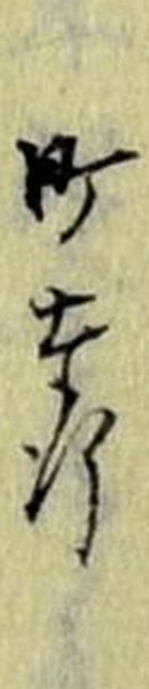御奉行
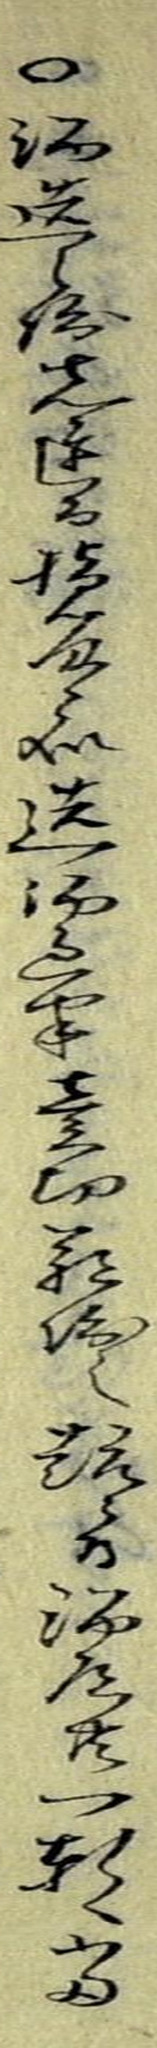○酒造之儀先達而指留候処造酒過半売切難儀之趣に付酒屋共一軒へ当
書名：命令之部 六
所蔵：福井県文書館 Fukui Prefectural Archives
